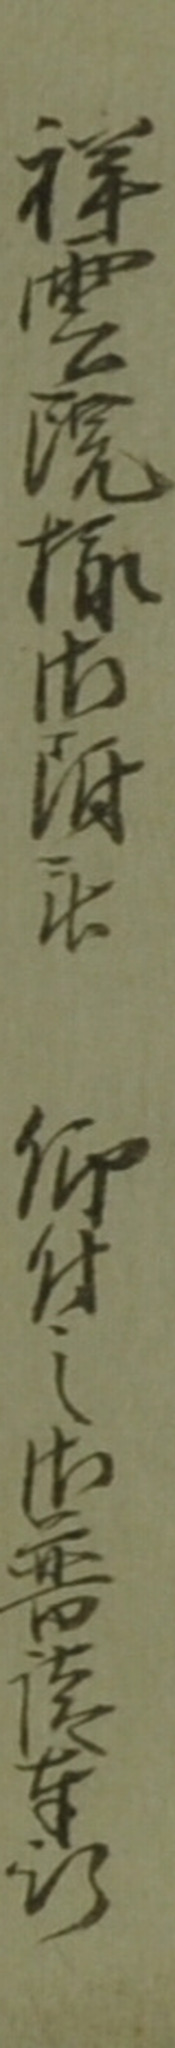祥雲院様御附被仰付之御普請奉行
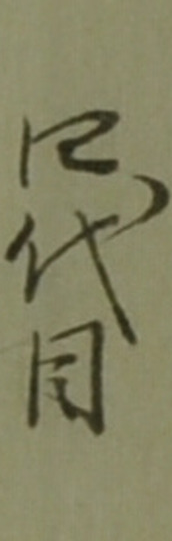四代目
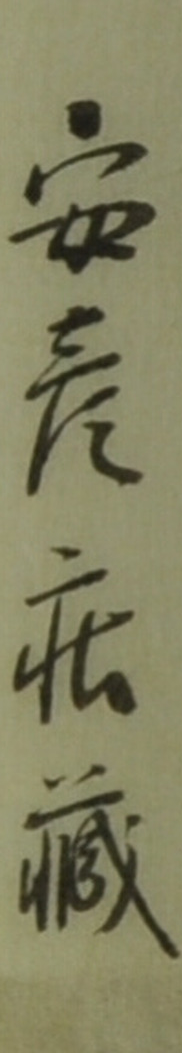安彦庄蔵

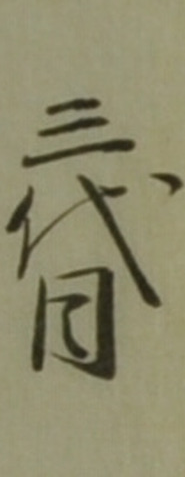三代目
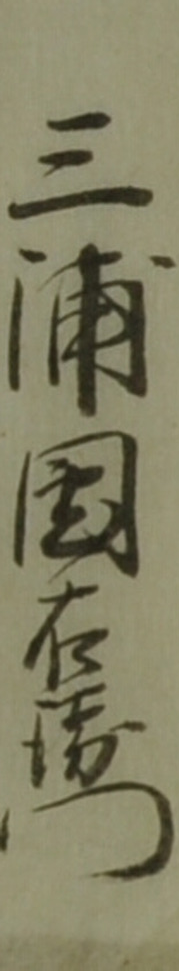三浦国右衛門
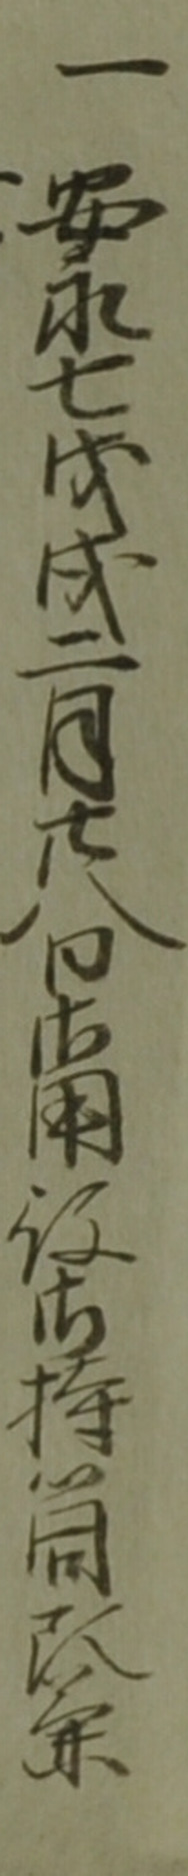一安永七戊戌二月廿八日御用役御持筒頭兼
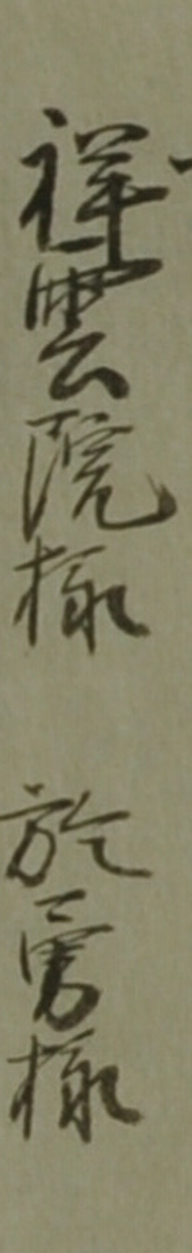祥雲院様於勇様
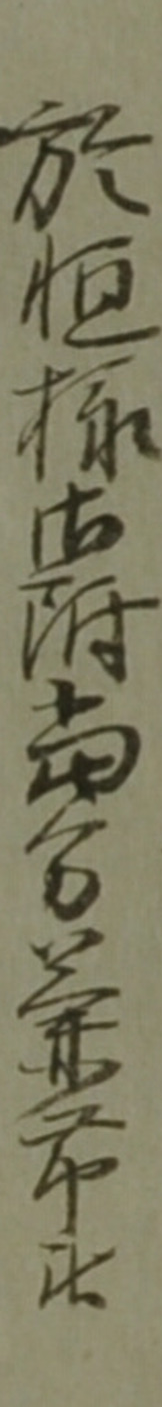於恒様御附当分兼帯被
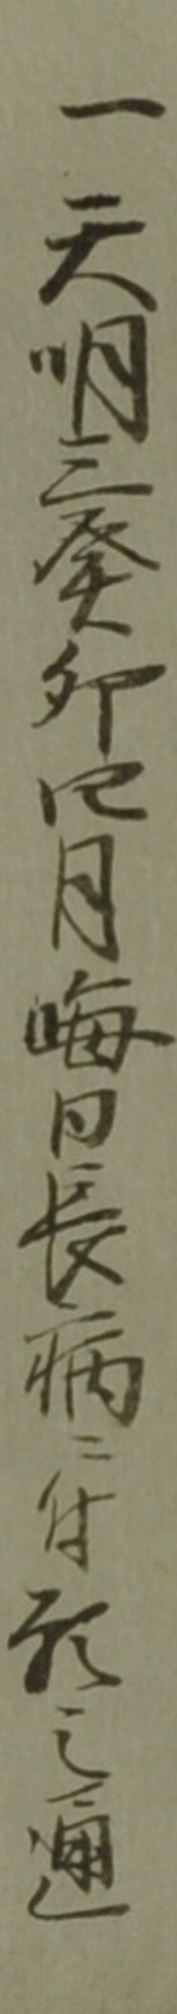一天明三癸卯四月晦日長病ニ付願之通
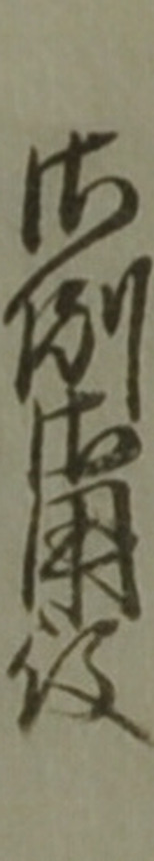御側御用役
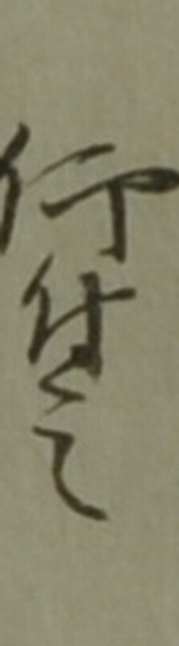仰付之
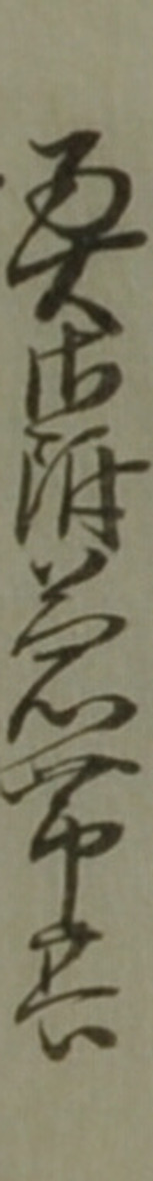奥御附兼帯共
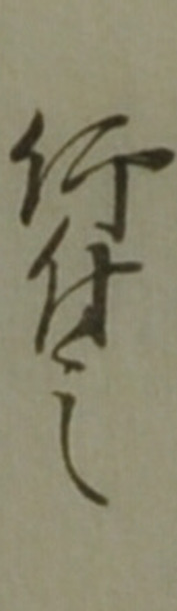仰付之
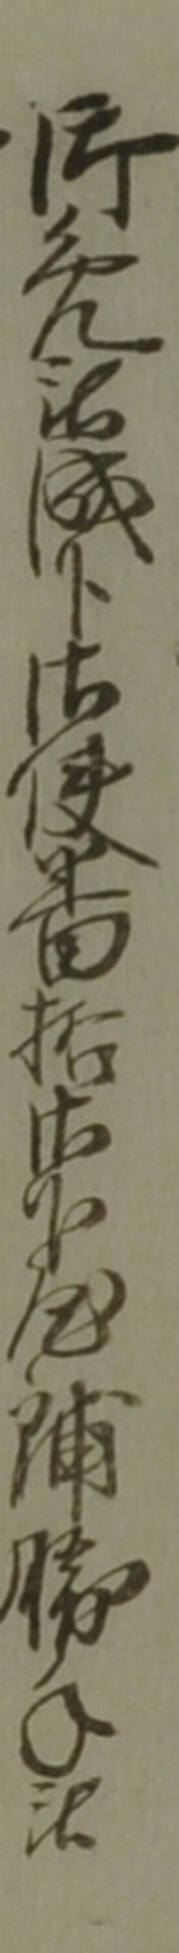御免被成下御使番格御下屋鋪勝手被
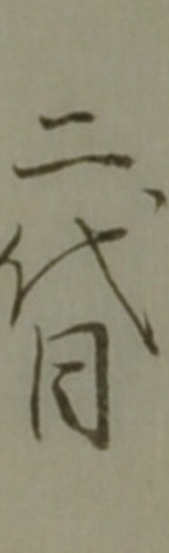二代目
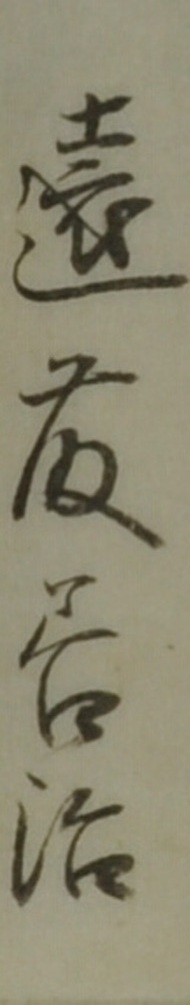遠藤善治
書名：諸御役代々録（六）
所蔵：伊那市立高遠町図書館・合同会社AMANE
